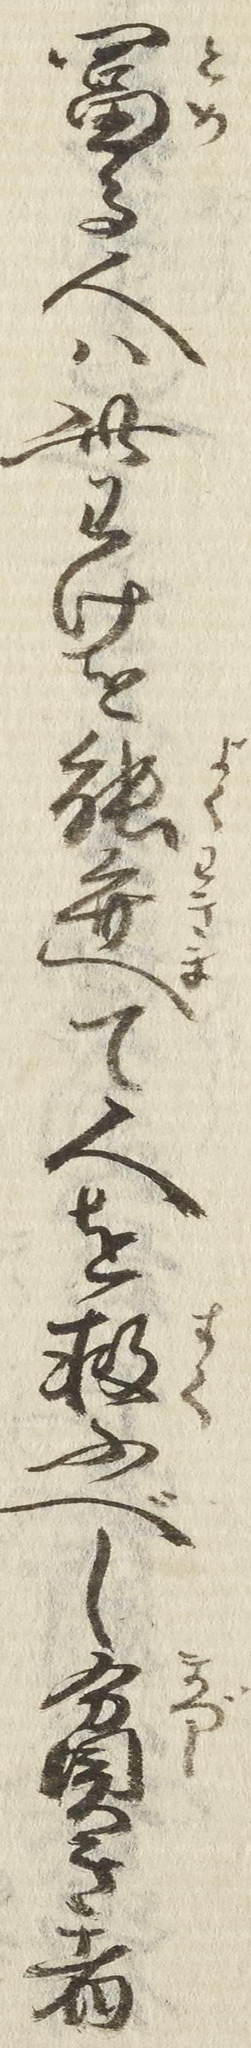富る人は此わけを能弁へて人を救ふべし貧き者
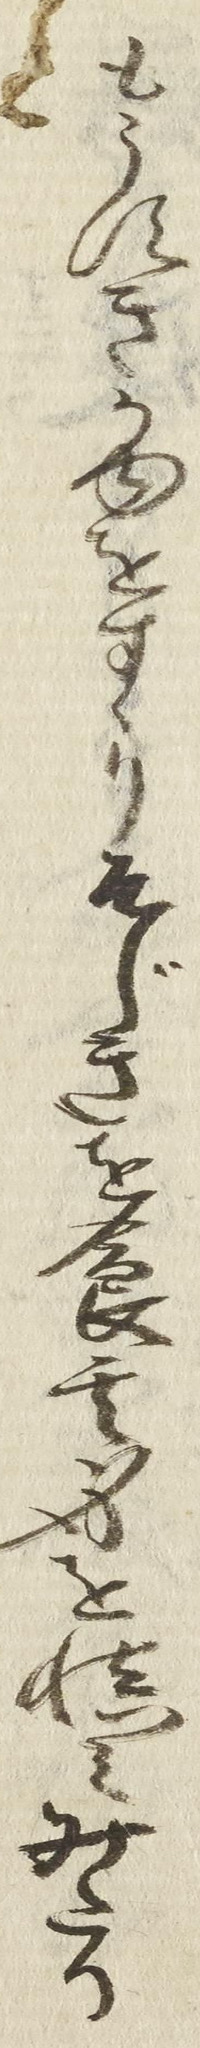もうすきかゆをすゝりそじきを食其身を慎みみたり
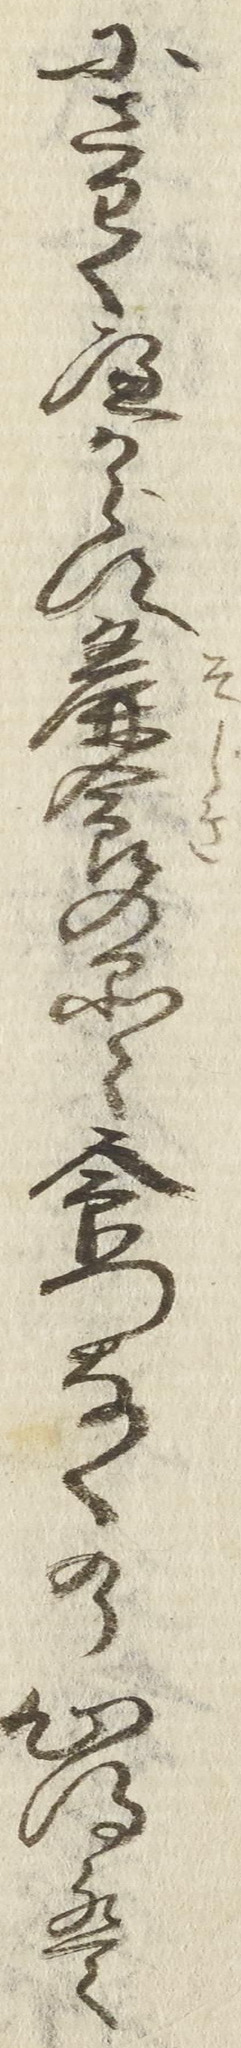にさわくへからす麁食の品〻食つなくの心得は
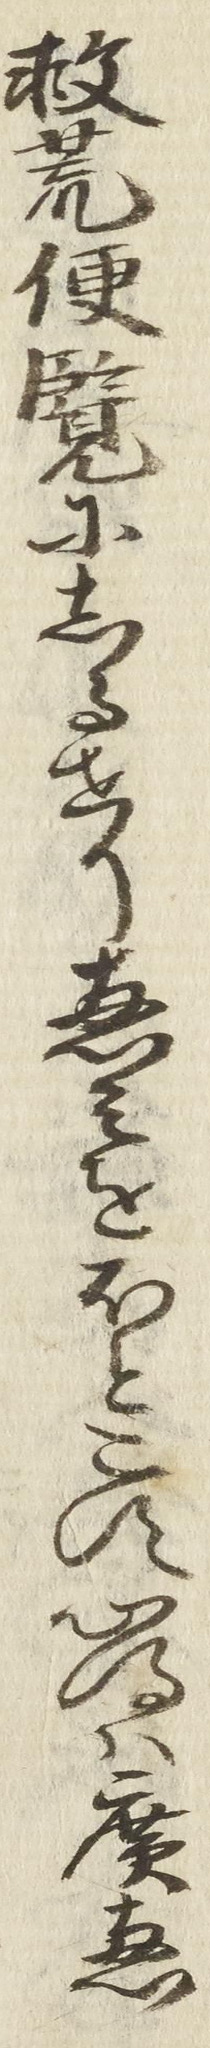救荒便覧にしるせり恵みをほとこす心得は廣恵
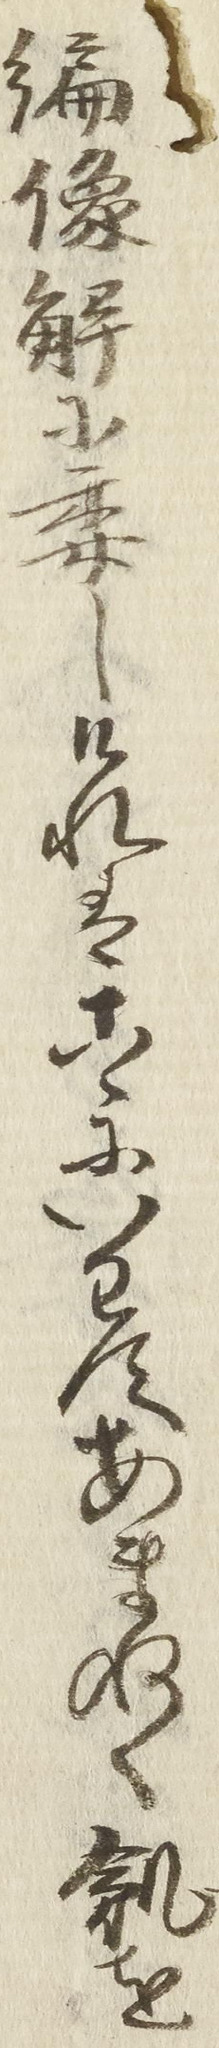編像解に委しけれはこゝにいわすあまねく飢を
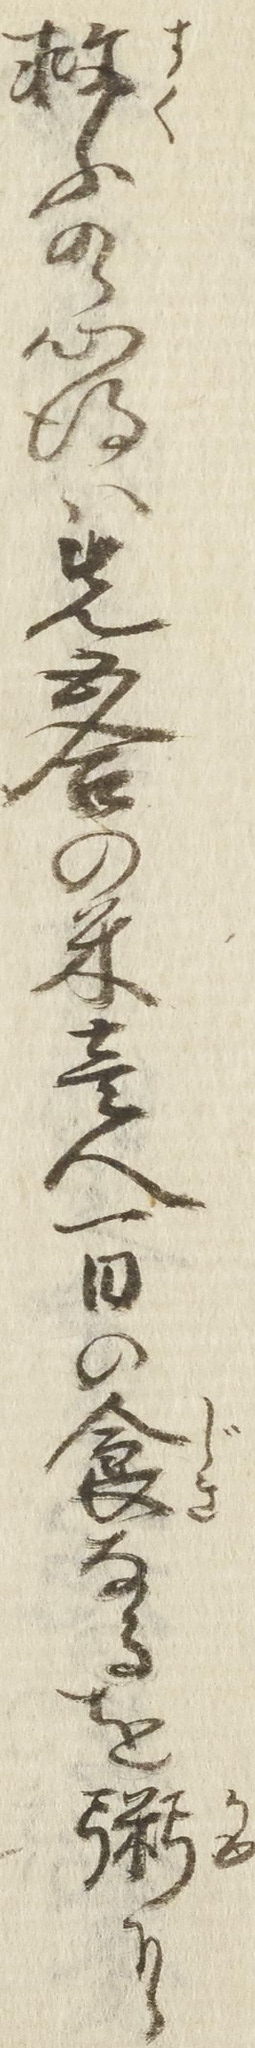救ふの心得は先五合の米壱人一日の食なるを粥に
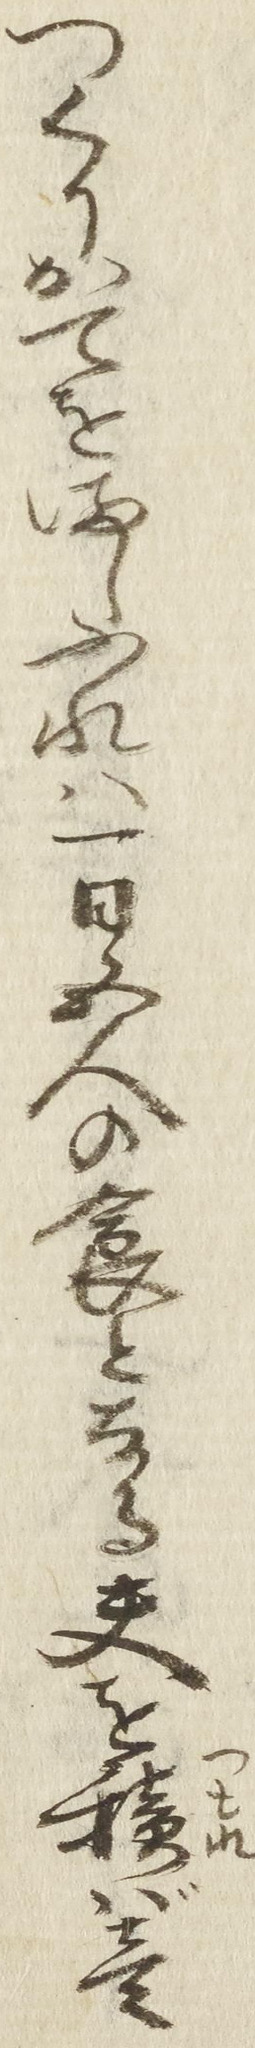つくりかてをましふれは一日五人の食となる夫を積ば壱
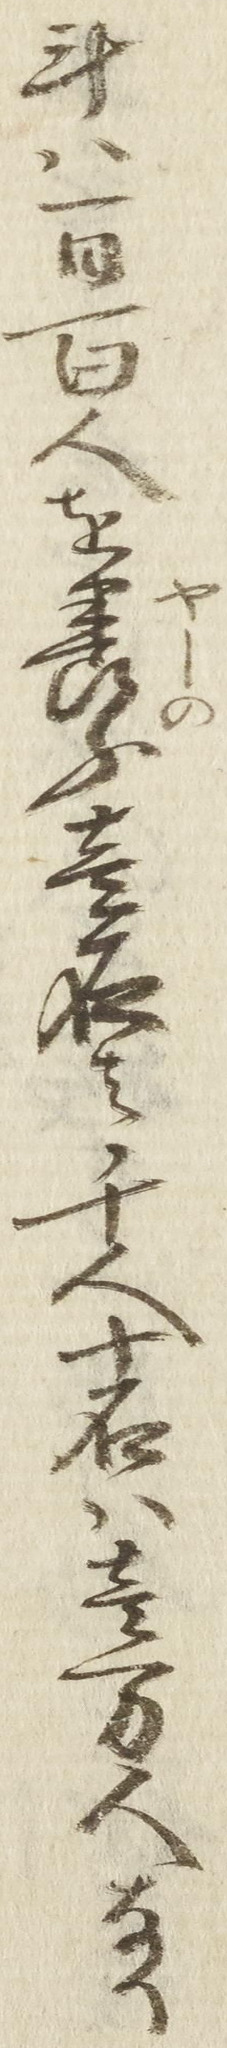斗は一日百人を養ふ一石は千人十石は壱万人なり
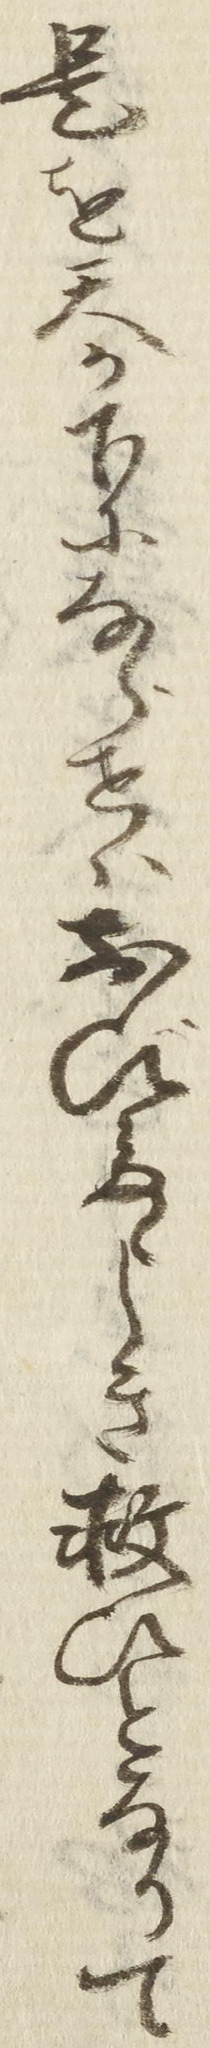是を天か下にならせはおびたゝしき救ひとなりて
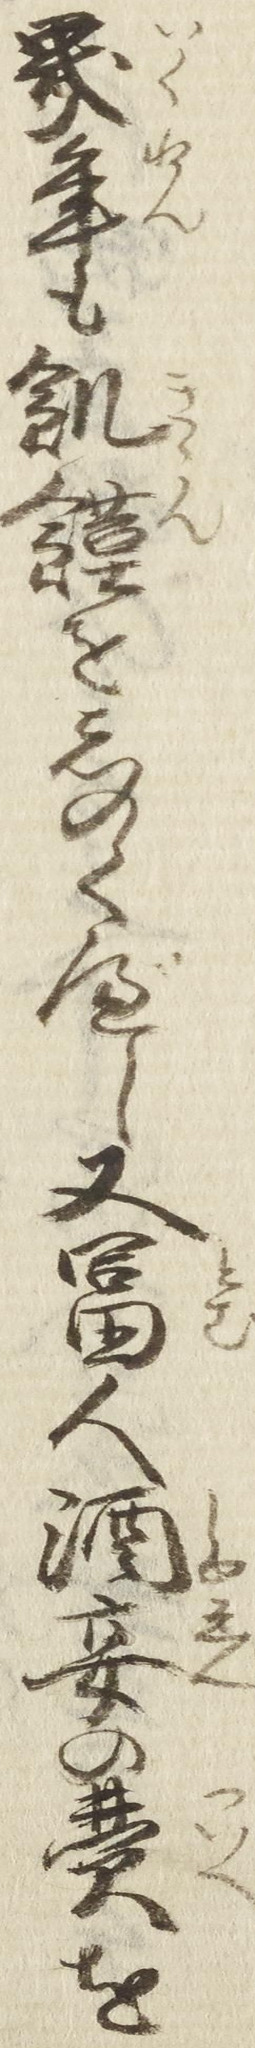幾年も飢饉をしのくべし又富人酒宴の費を
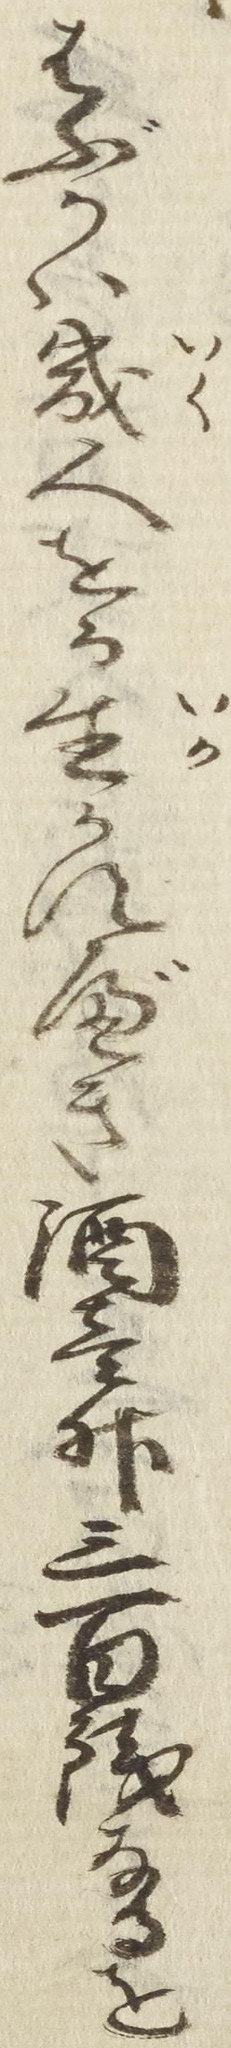はぶかは幾人をか生かすべき酒壱升三百銭なるを

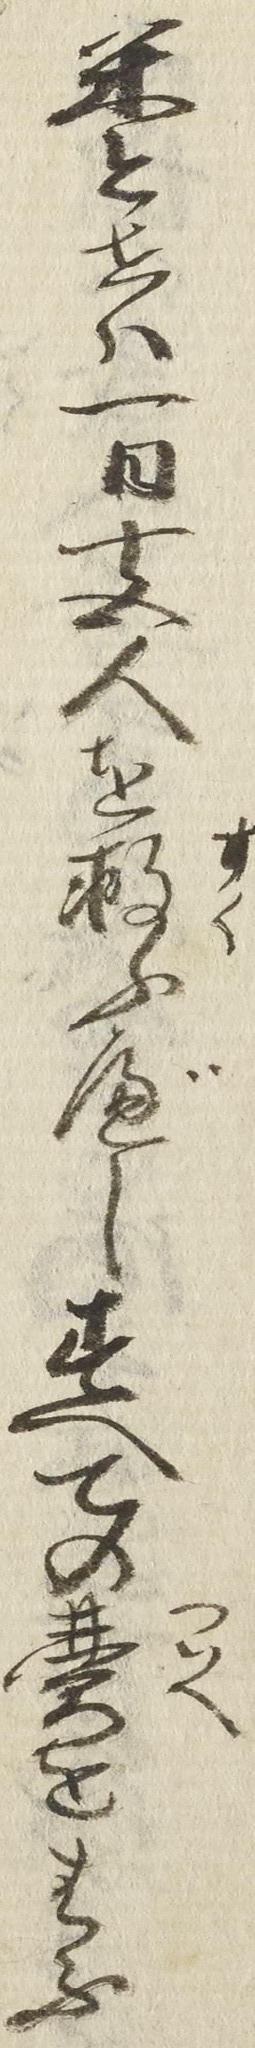米とせは一日十五人を救ふべしすへての費をはふ
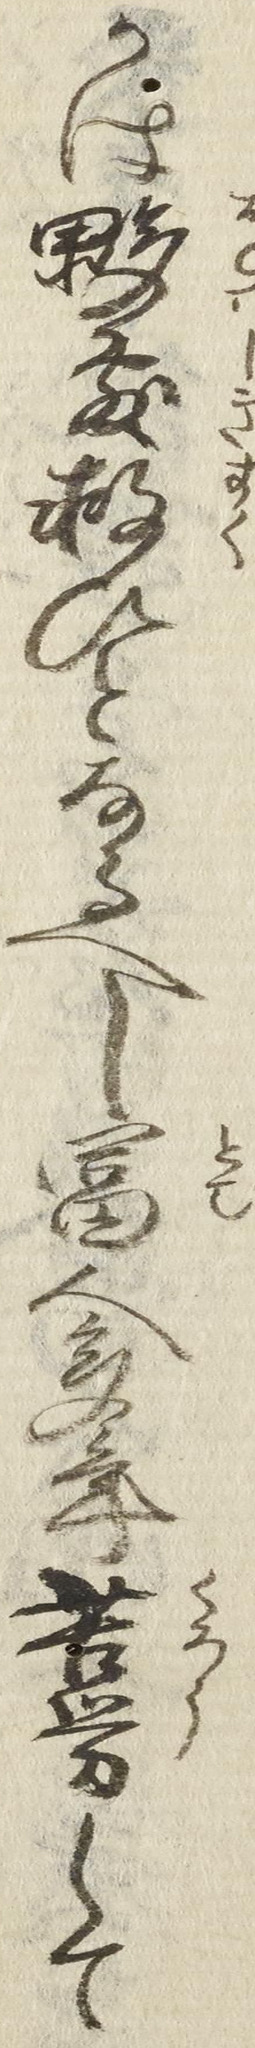かは夥敷救ひとなるへし富人多年苦労して
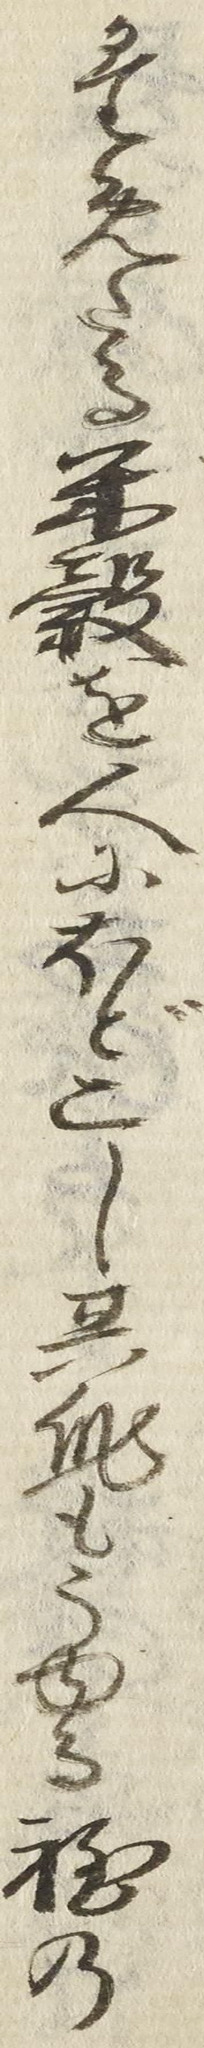ためたる米穀を人にほどこし其身うゆる程の
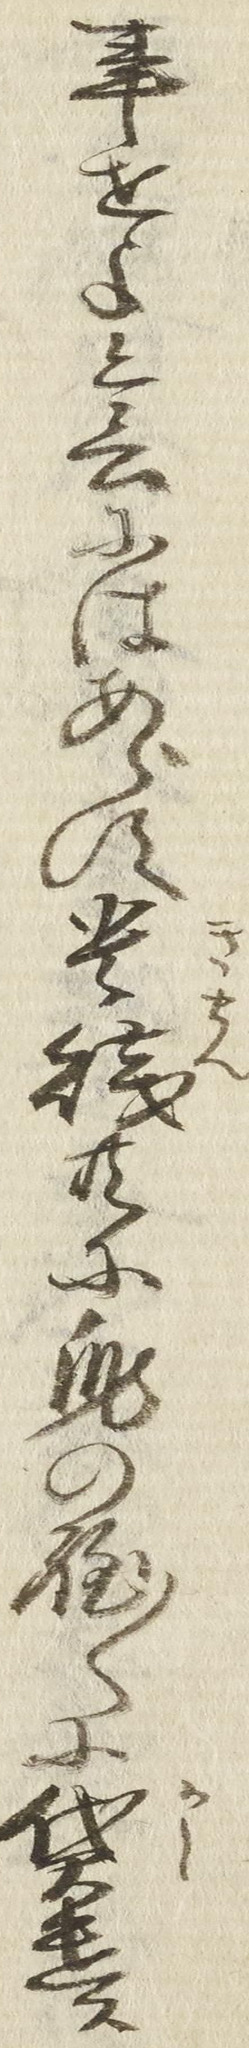事せよと言にはあらす貴賤共に身の程〳〵に貸遣ス
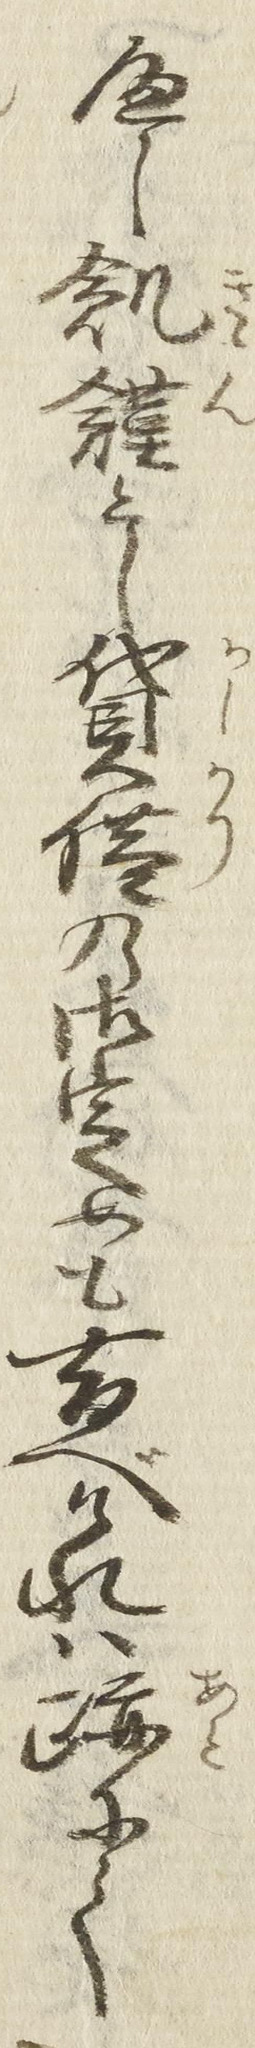へし飢饉とし貸借の御定めも有べけれは跡にて
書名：天明奇畧　全
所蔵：東京大学地震研究所図書室 Earthquake Research Institute Library, The University of Tokyo, JAPAN
